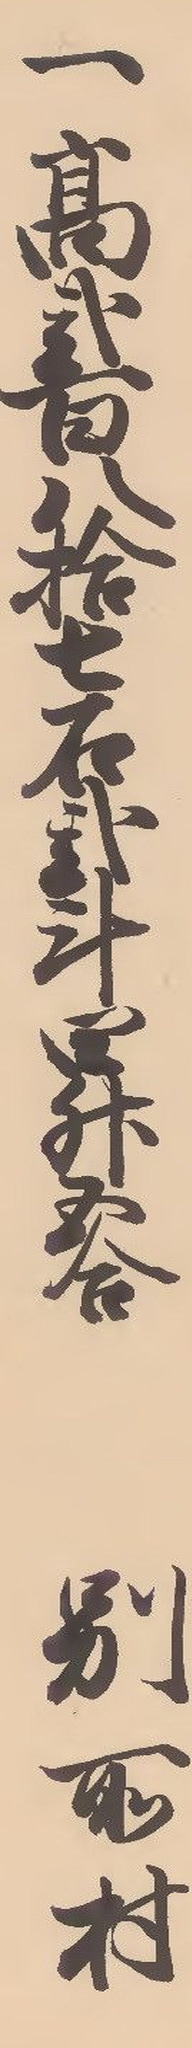一高弐百八拾七石弐斗四升五合別所村

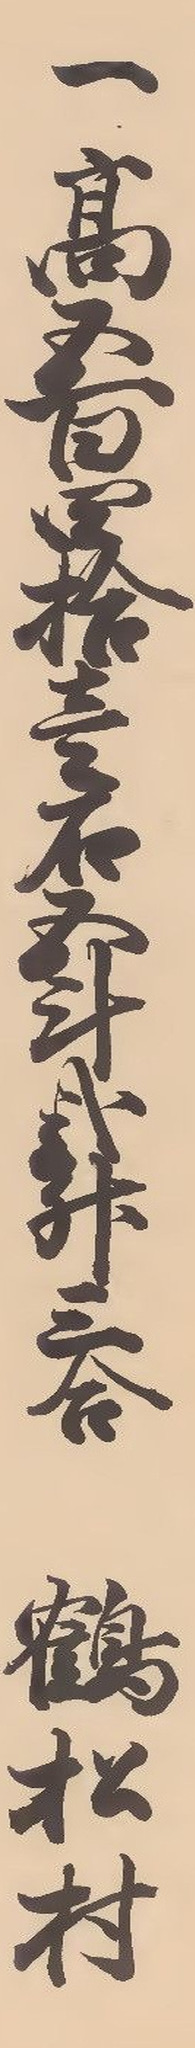一高五百四拾壱石五斗弐升三合鶴松村
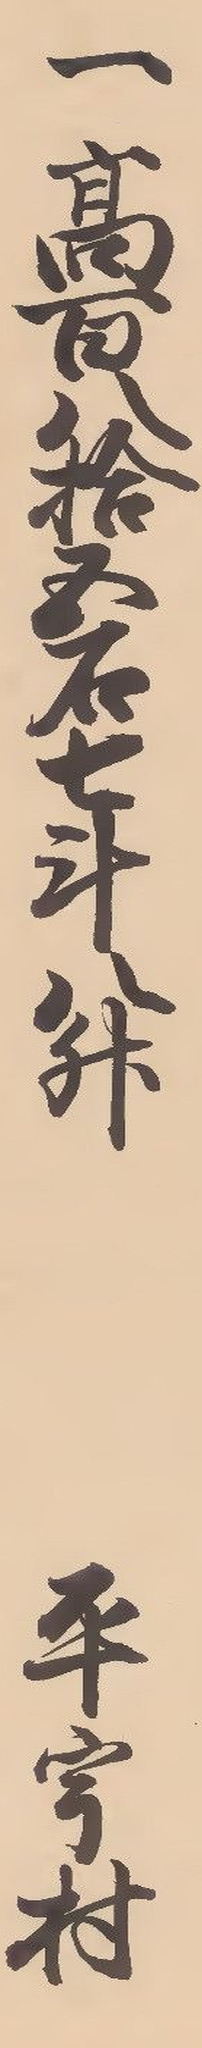一高百八拾五石七斗八升平宇村
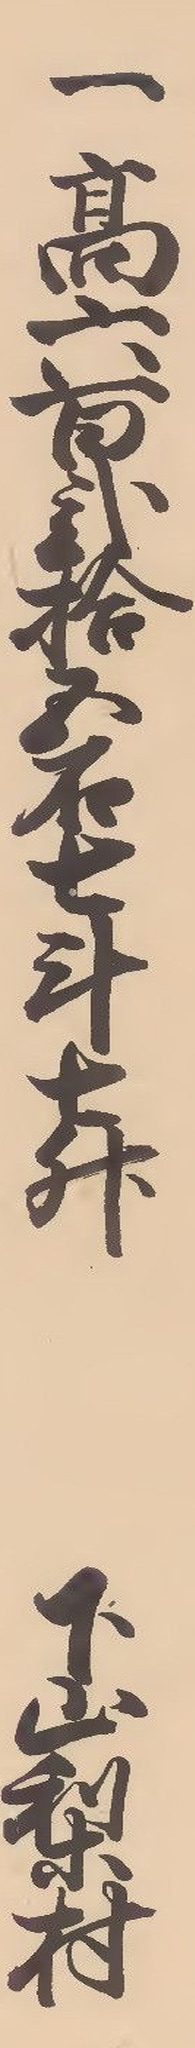一高六百弐拾五石七斗七升下山梨村
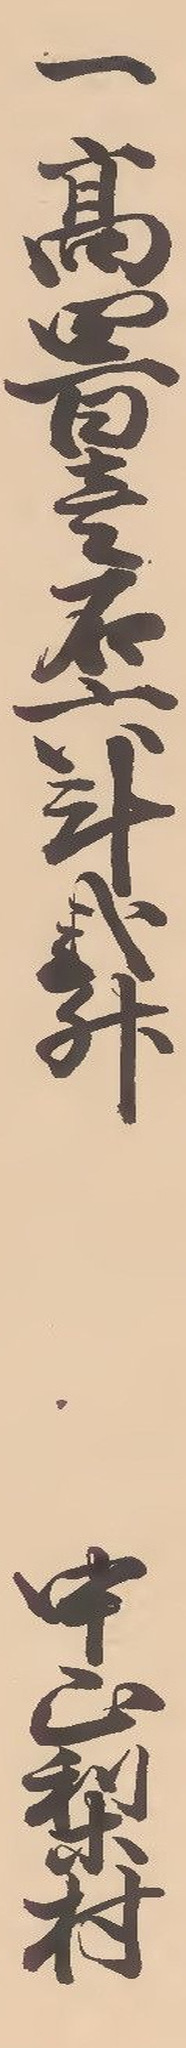一高四百壱石六斗弐升中山梨村
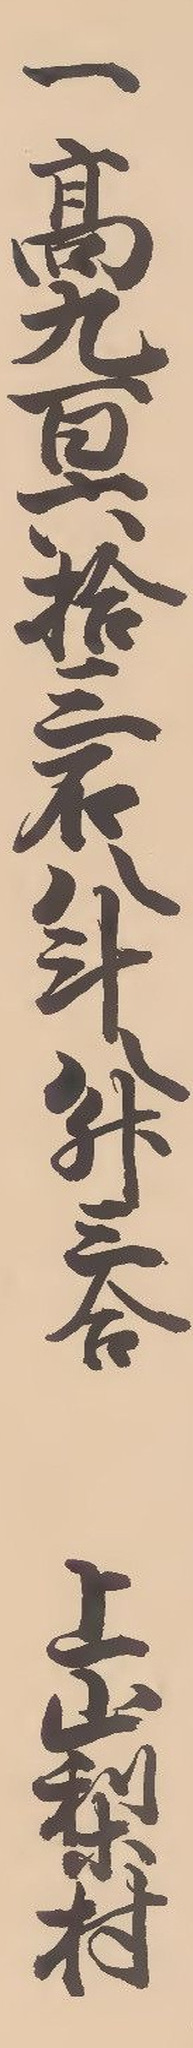一高九百六拾三石八斗八升三合上山梨村
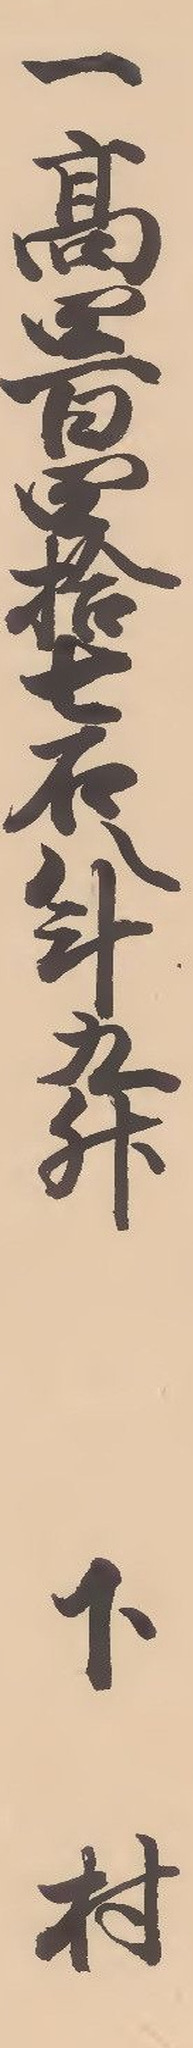一高四百四拾七石八斗九升下村
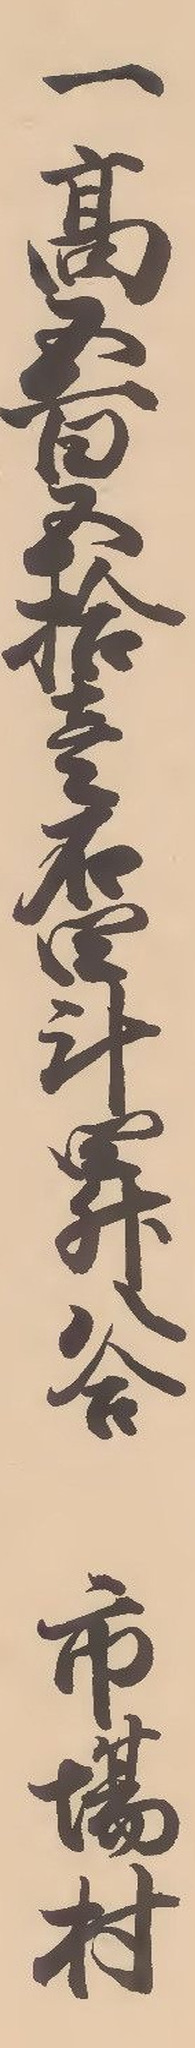一高五百五拾壱石四斗四升八合市場村
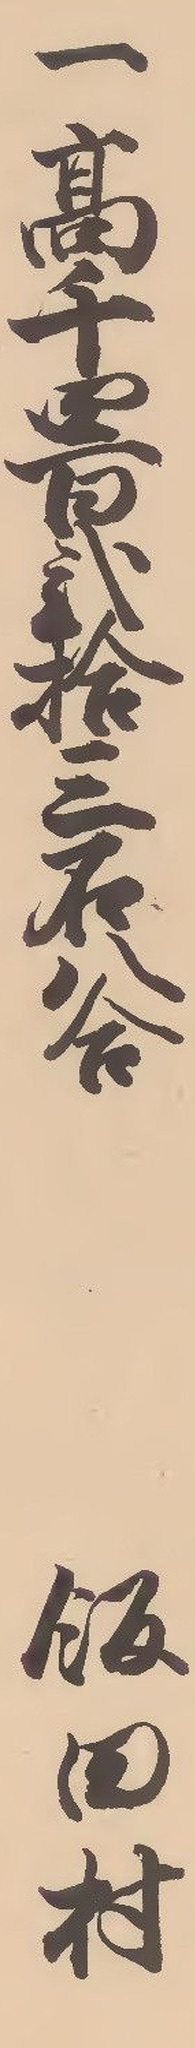一高千四百弐拾三石八合飯田村

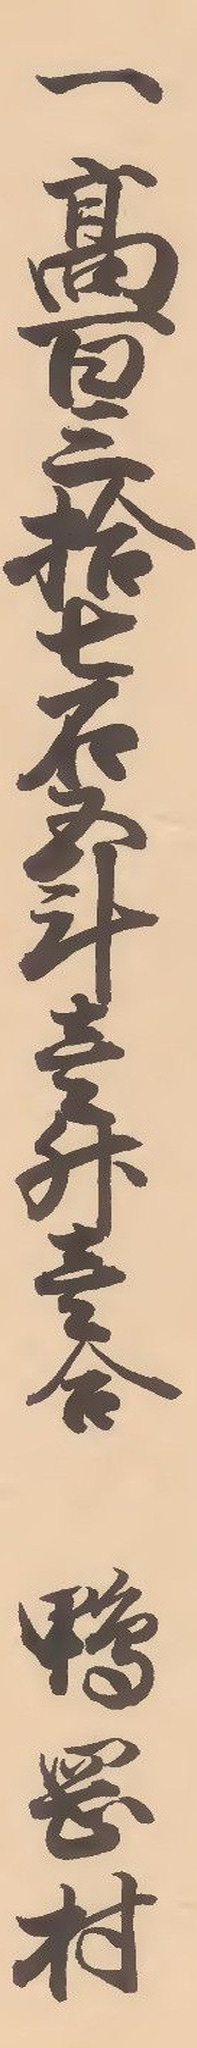一高百三拾七石五斗壱升壱合鴨岡村
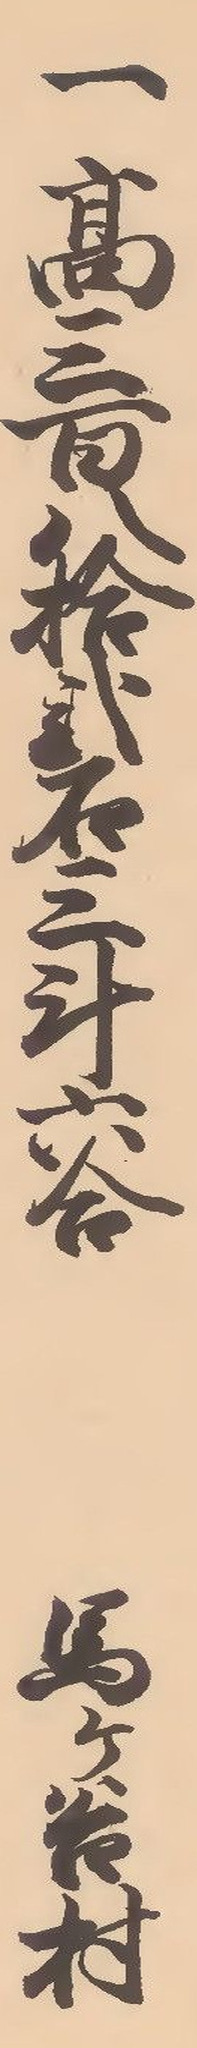一高三百八拾弐石三斗六合馬ヶ谷村
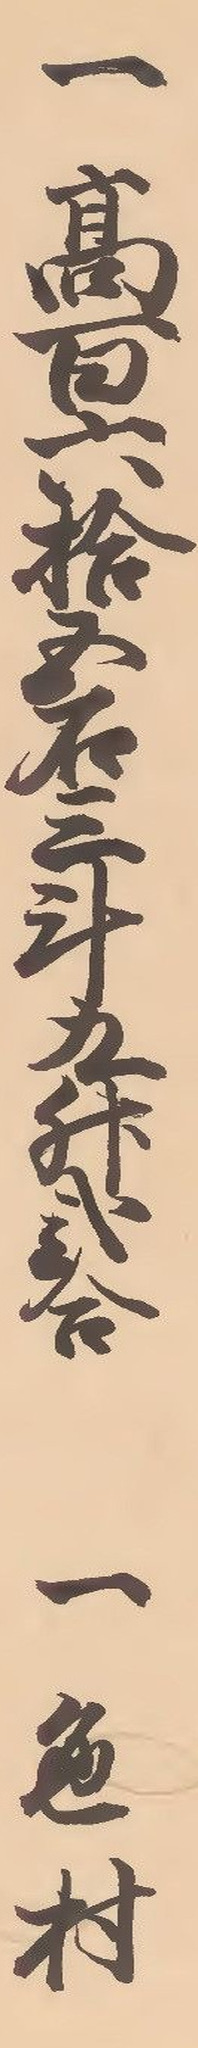一高百六拾五石三斗九升弐合一色村
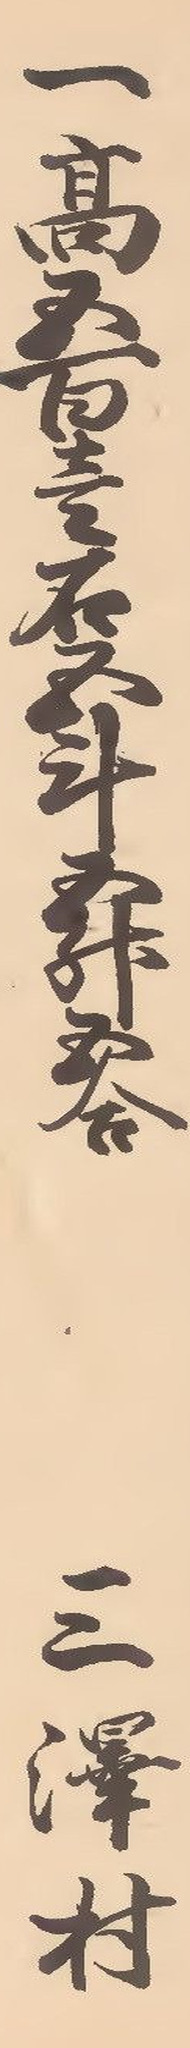一高五百壱石五斗五升五合三沢村
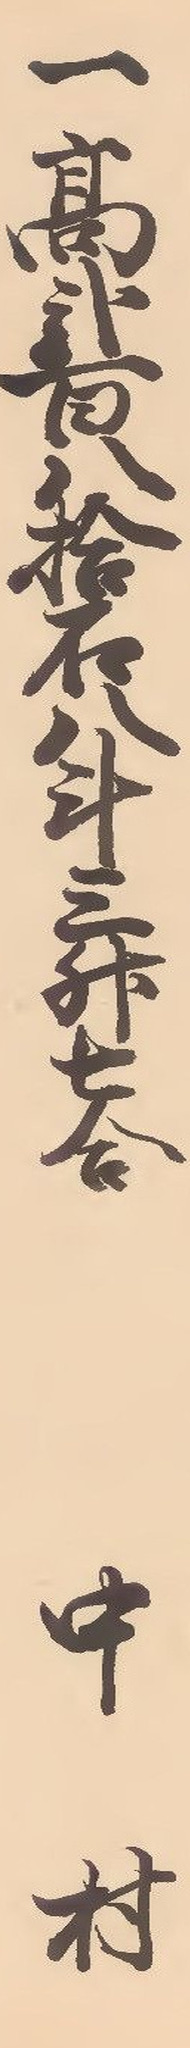一高弐百八拾石八斗三升七合中村
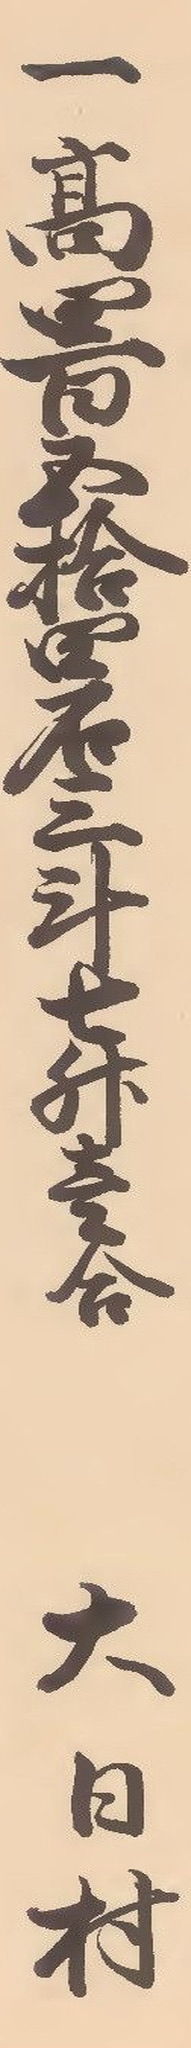一高四百五拾四石三斗七升壱合大日村
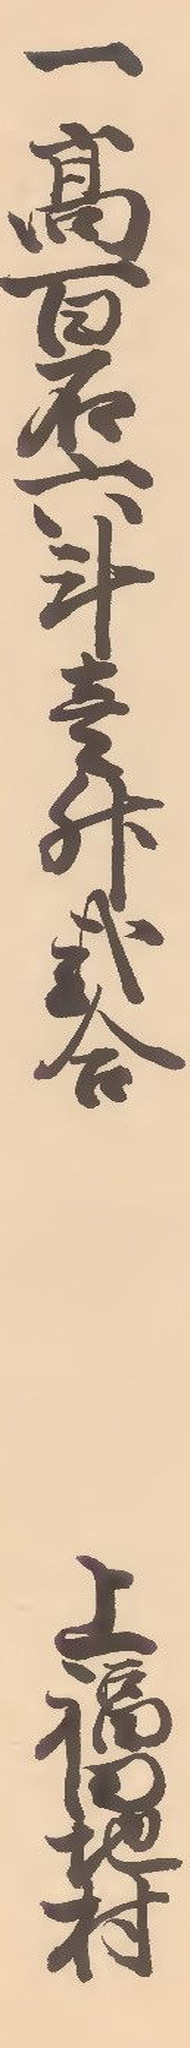一高百石六斗壱升弐合上福田地村
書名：遠江国郷帳
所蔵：国立公文書館 National Archives of Japan
